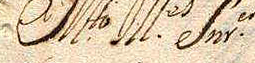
M.to Ill.es Snr.es
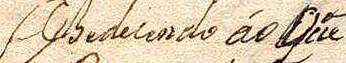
Obedecendo áo Que
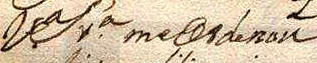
V.a Sr.a me ordenou
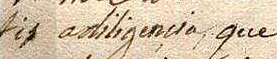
fis a diligençia, que
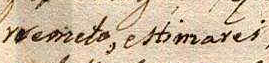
rremeto, estimarei,
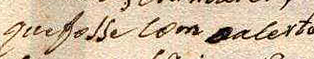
que fosse com o acerto
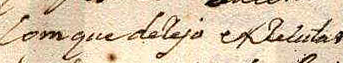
Com que deZejo exZecutar
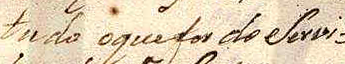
tudo o que for do Servi
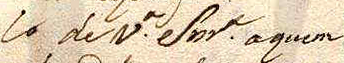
Ço de V.a Snr.a a quem
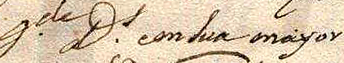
G.de D.s em Sua mayor
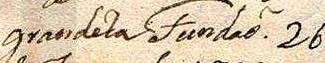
grandeZa Fundaõ. 26
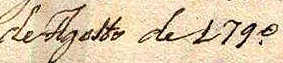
de Agosto de 1790.
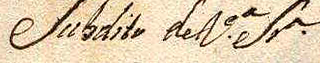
Subdito de V.a Sr.a
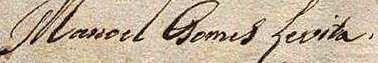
Manoel Gomes Levita
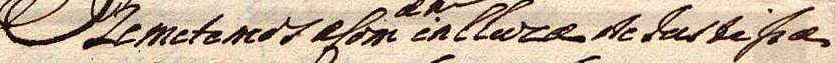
Remetemos a Com.am inCluza de Iustissa
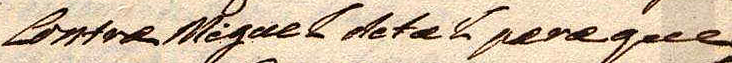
Contra Miguel de tal para que
